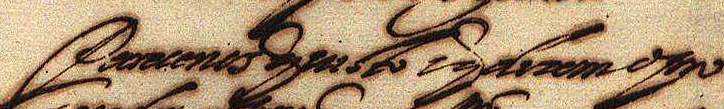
Parecenos q̄ uisto o q̄ dizem o pro
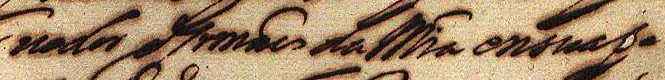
uedor e Jrmaõs da Miā en sua pe
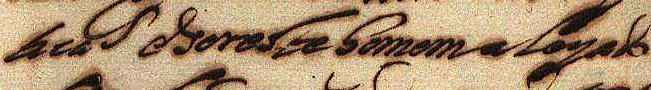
tiçaõ e ser este homem aleyado
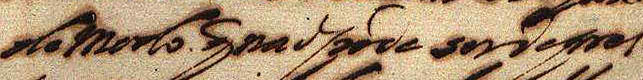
de modo q̄ naõ pode ser de pres
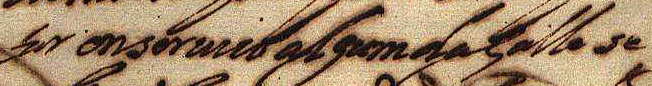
tar en seruiço algum da Galle se
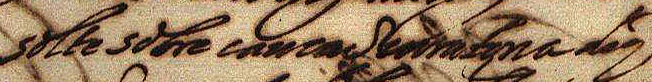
solte sobre cauçaõ iuratoria de q̄
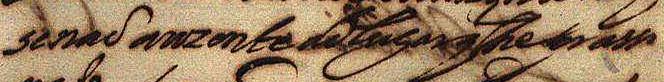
se naõ auzente do lugar q̄ lhe for assi
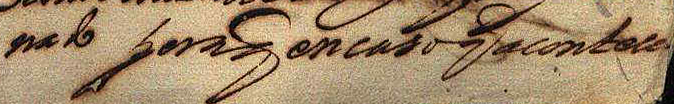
nado pera q̄ en caso q̄ acontece
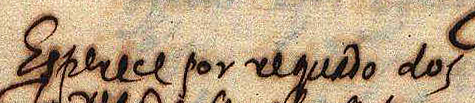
Esperece por requado dos
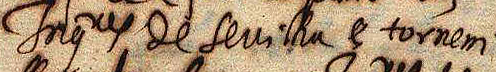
Inqres de seuilha e tornem
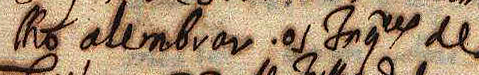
lho a lembrar os Inqres de
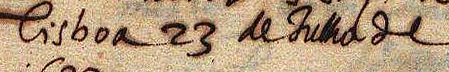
lisboa 23 de Iulho de
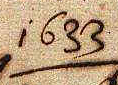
i633
